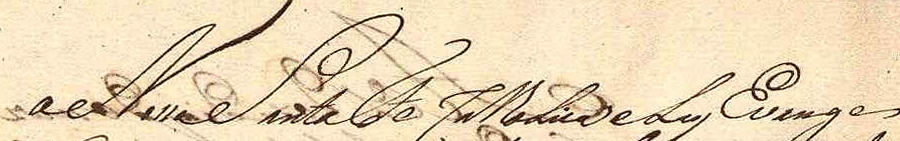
a Nossa Santa Fe CathoLica e Ley Evange
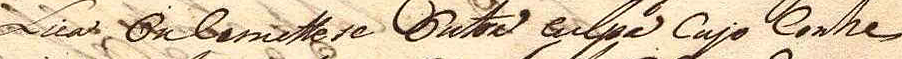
Lica Ou Comettese Outra culpa Cujo Conhe
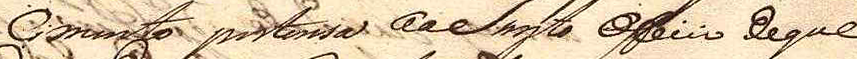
Cimento pertensa ao Santo Officio de que
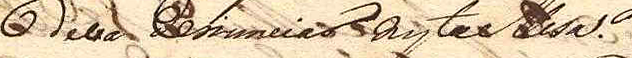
deva denunciar nesta Mesa.
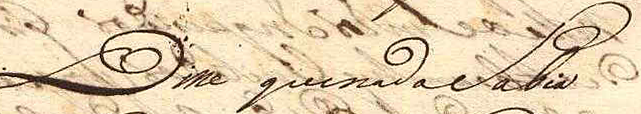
Disse que nada Sabia
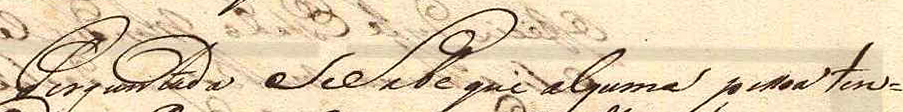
Perguntada se Sabe que alguma pessoa ten
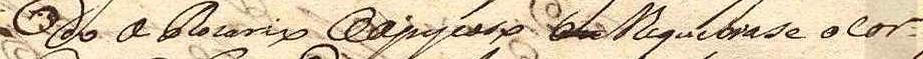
do o Rozario ao pescoso ou lhe quebrase o cor
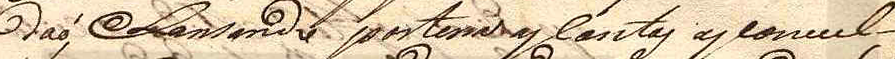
daõ, e Lansando por terra as Contas as conccel
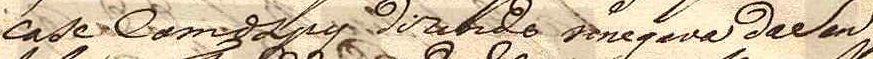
case com os pes dizendo se negava da San
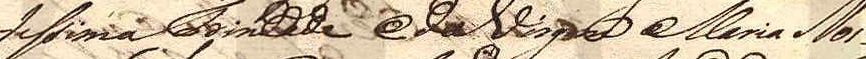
tissima Trindade e da Virgem Maria Nos
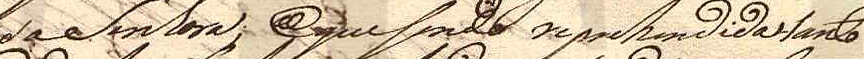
sa Senhora; E que sendo reprehendida Santo
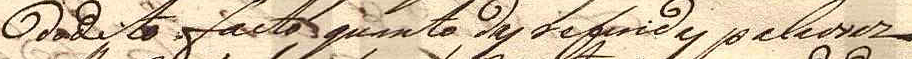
do dito facto quanto das referidas palavraz
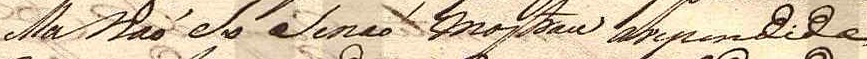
ella naõ So Senaõ mostrou arependida
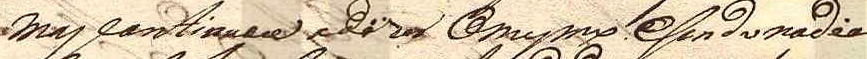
mas continuou a dizer O mesmo e sendo no dia
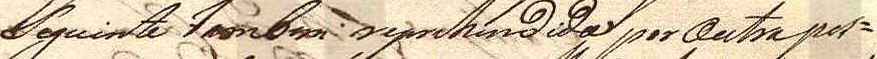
Seguinte tambem reprehendida por outra pes
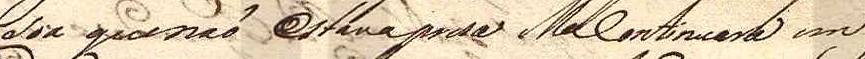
soa que naõ estava presa ella Continuara em
